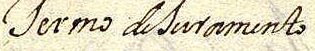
Termo de Iuramento
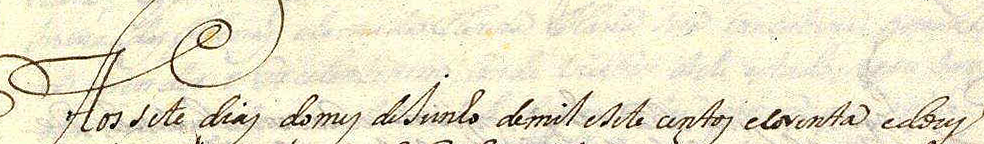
Aos sete dias do mes de Iunho de mil e setecentos e corenta e dous
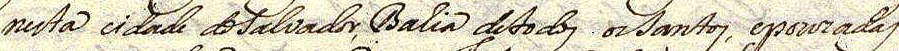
nesta cidade do Salvador, Bahia de todos os Santos, e pouzadas
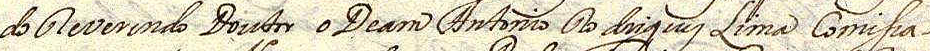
do Reverendo Doutor o Deam Antonio Rodrigues Lima Comissa
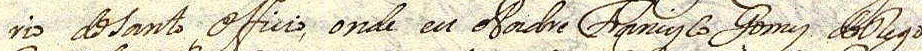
rio do Santo Officio, onde eu o Padre Francisco Gomes do Rego
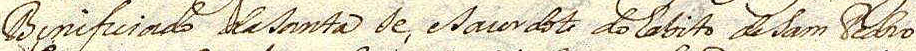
Benificiado da Santa Se, e Sacerdote do habito de Sam Pedro
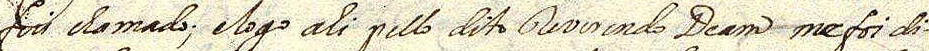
fui chamado; e logo ahi pello dito Reverendo Deam me foi di
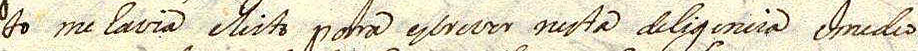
to me havia eleito para escrever nesta deligencia e me deo
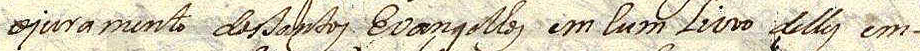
o juramento dos Santos Evangelhos em hum Livro delles em
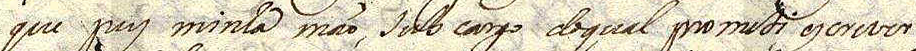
que pus minha mão, sub cargo do qual prometi escrever
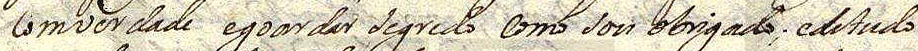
com verdade e goardar segredo como sou obrigado; e de tudo
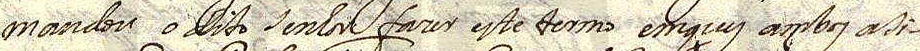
mandou o dito senhor fazer este termo em ques ambos asi
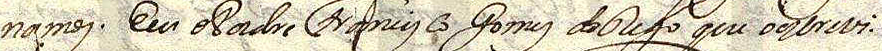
namos. E eu o Padre Francisco Gomes do Rego que o escrevi.
